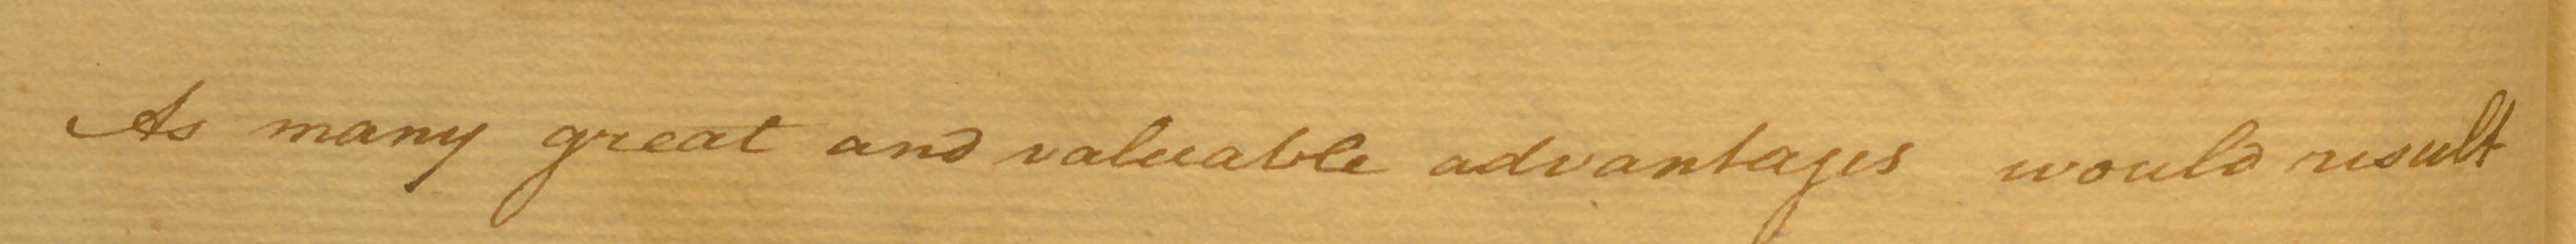As many great and valuable advantages would result
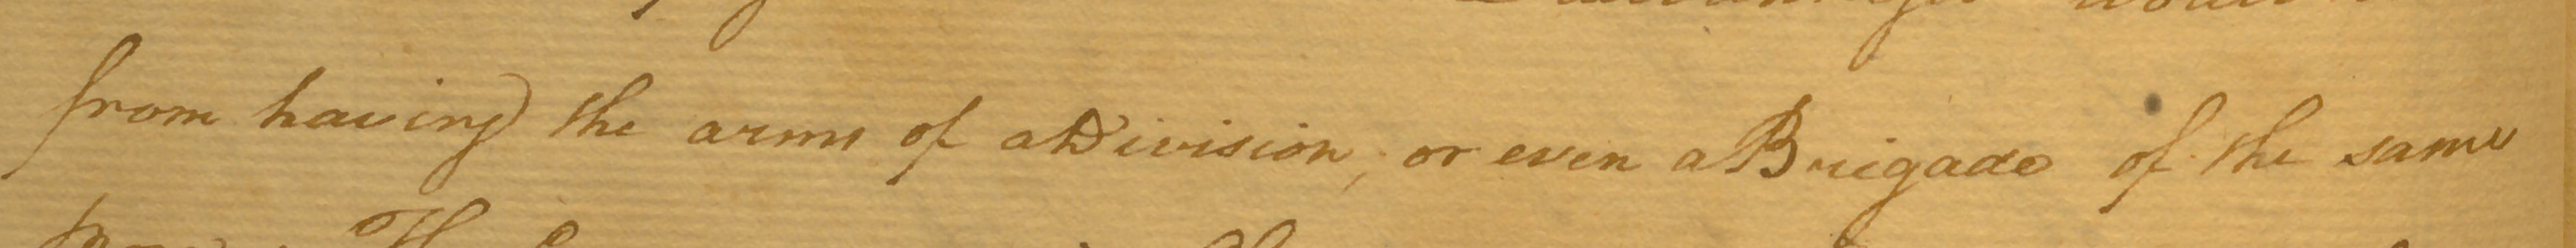from having the arms of a Division or even a Brigade of the same
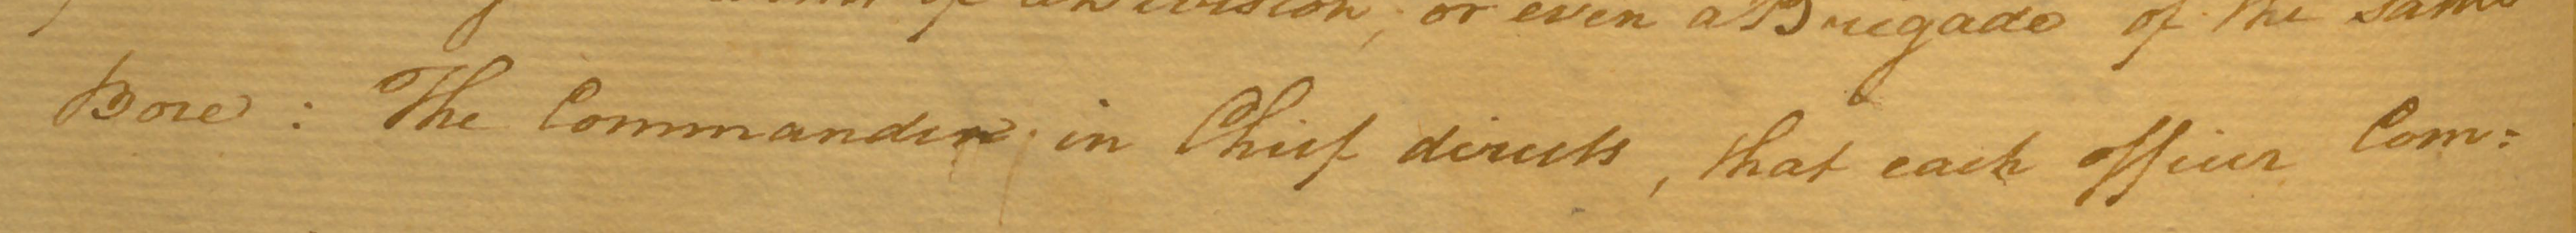Bore: The Commander in Chief directs that each officer Com-
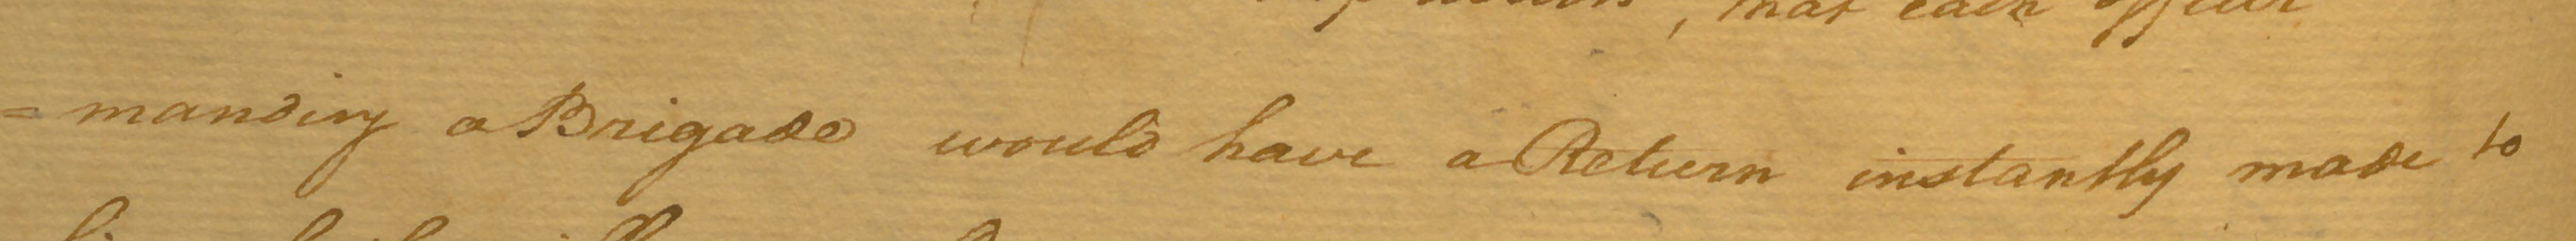-manding a Brigade would have a Return instantly made to
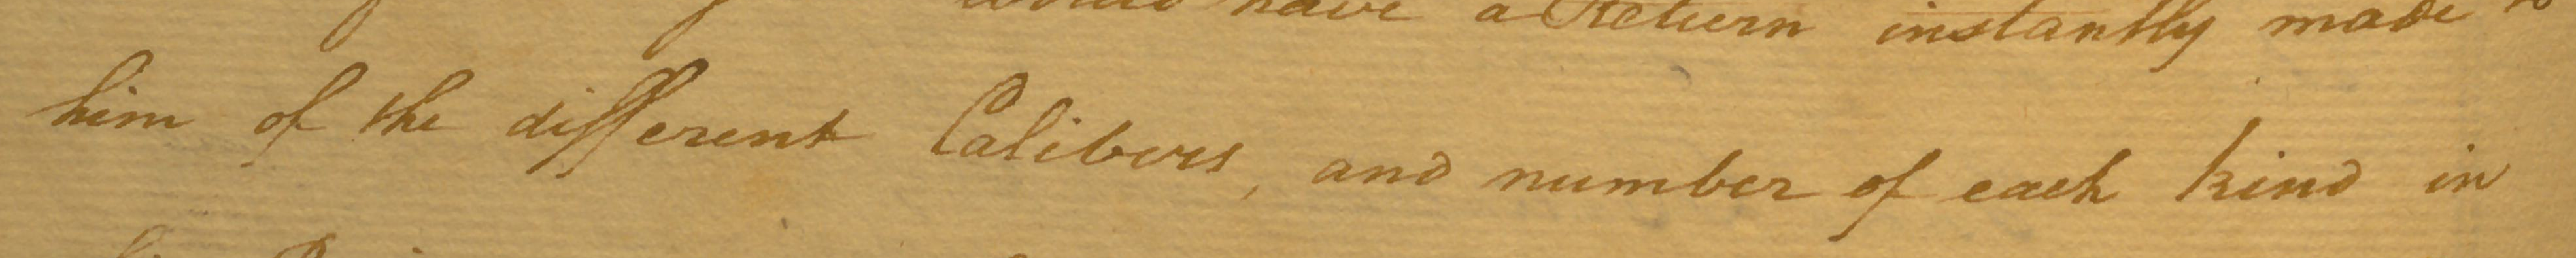him of the different Calibers and number of each kind in
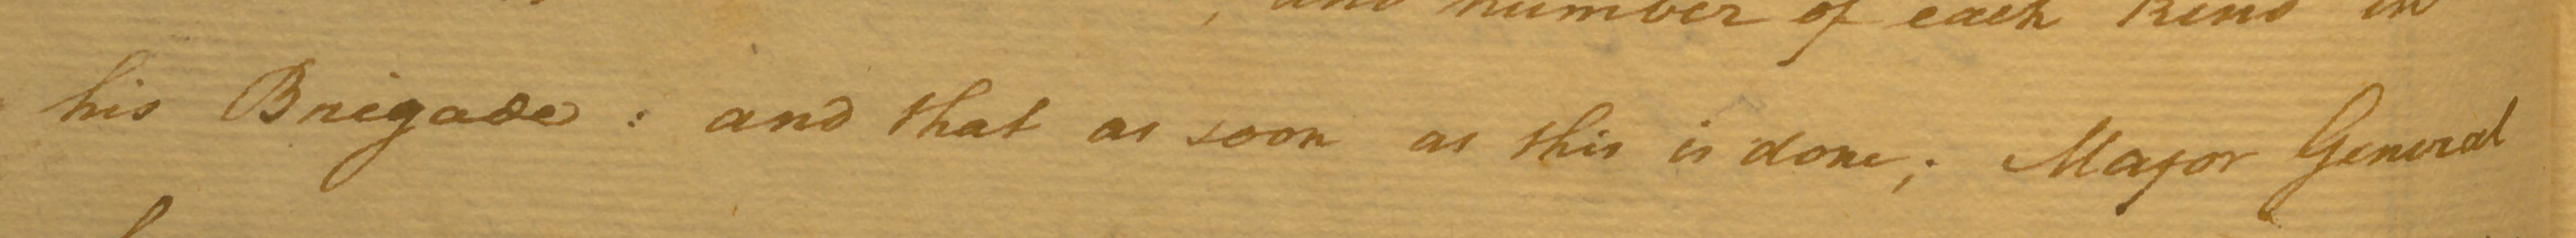his Brigade: and that as soon as this is done; Major General
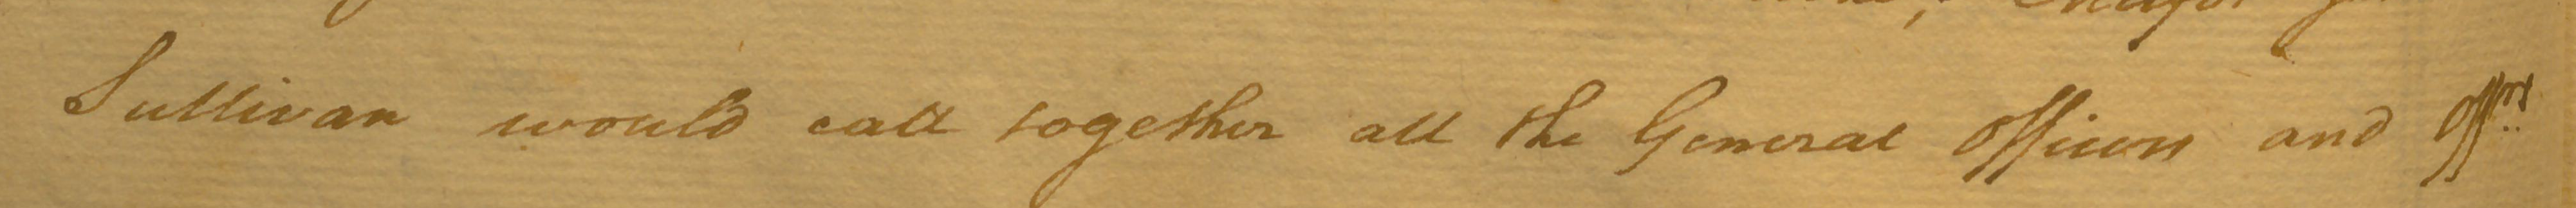Sullivan would call together all the General officers and Off^rs.
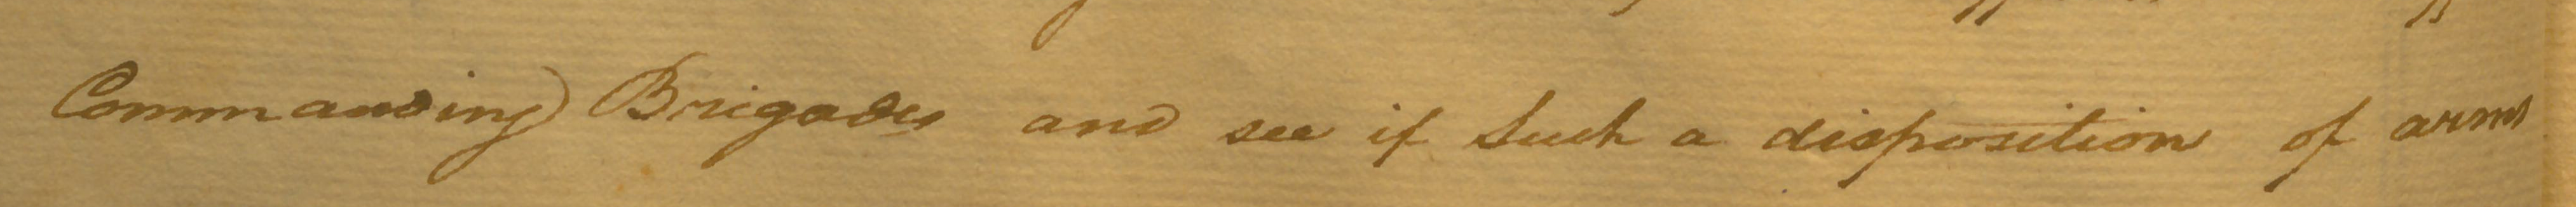Commanding Brigades and see if such a disposition of arms
